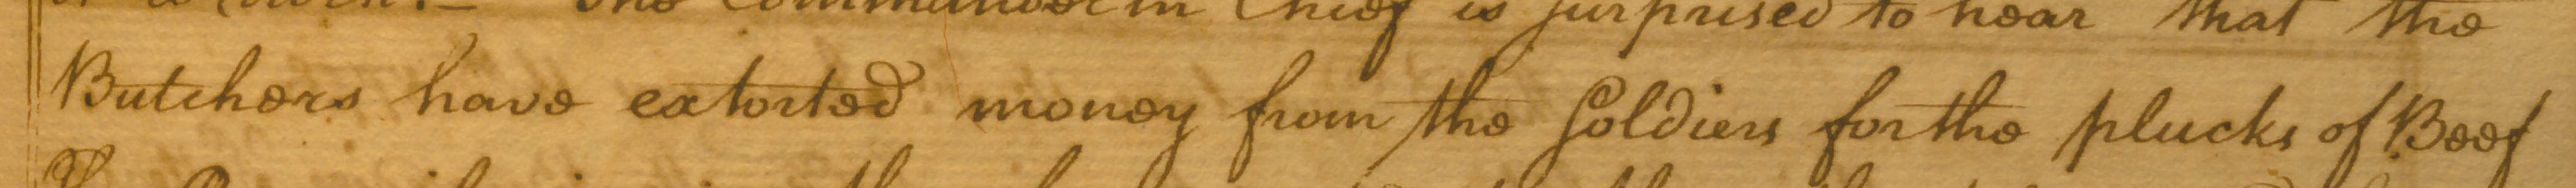Butchers have extorted money from the soldiers for the plucks of Beef
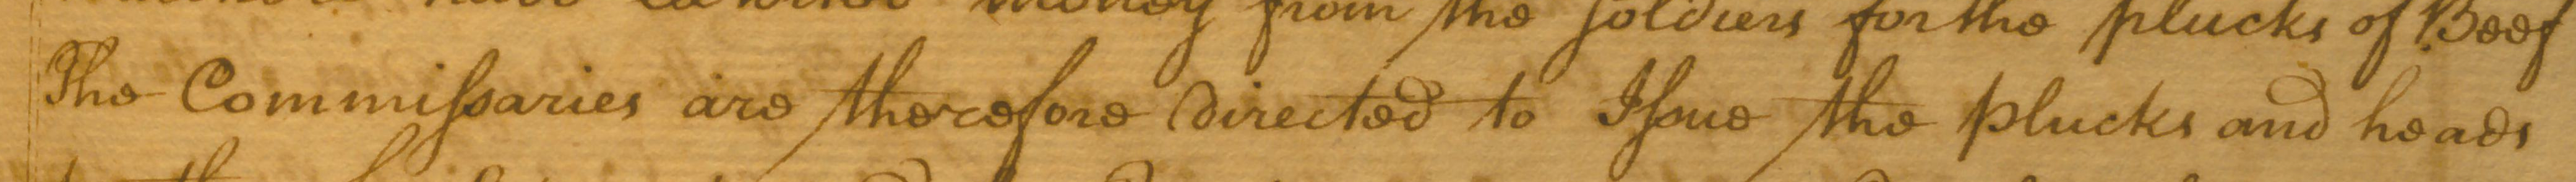The Commissaries are therefore directed to Issue the plucks and heads
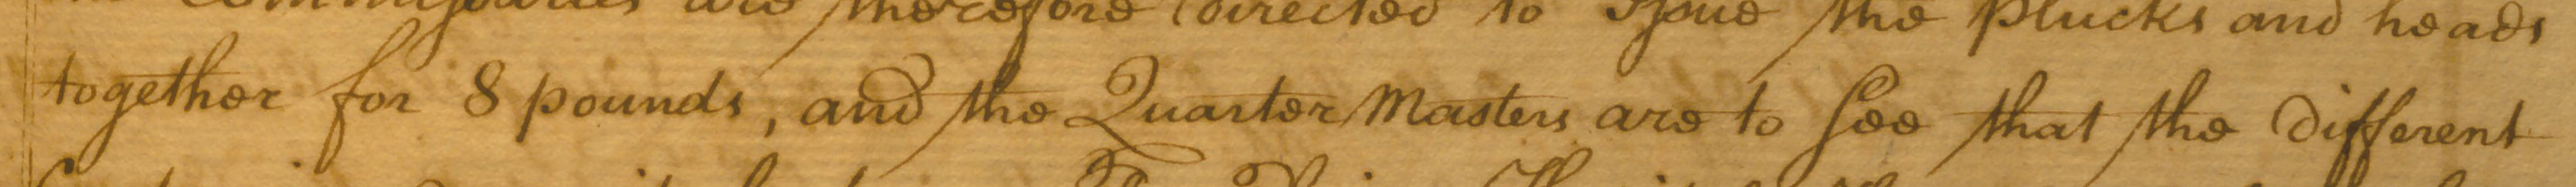together for 8 pounds, and the Quarter Masters are to see that the different
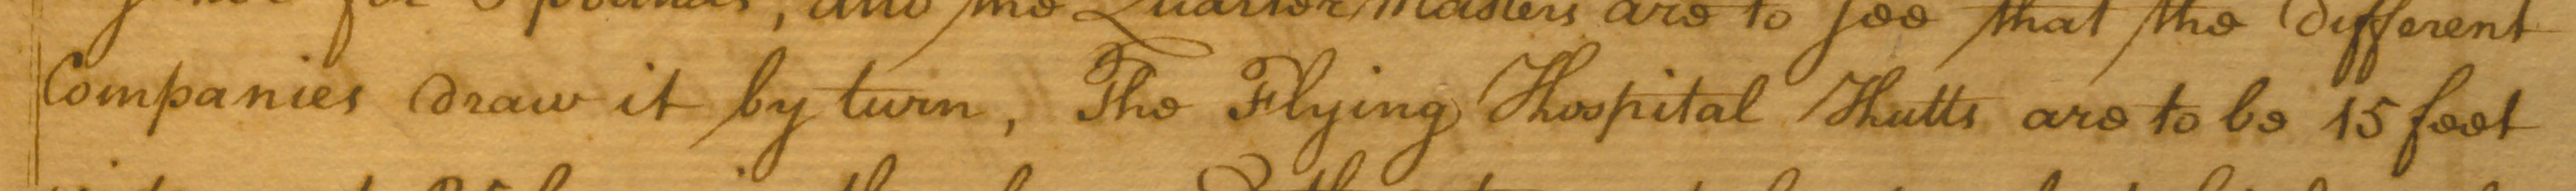Companies draw it by turn. The Flying Hospital Hutts are to be 15 feet
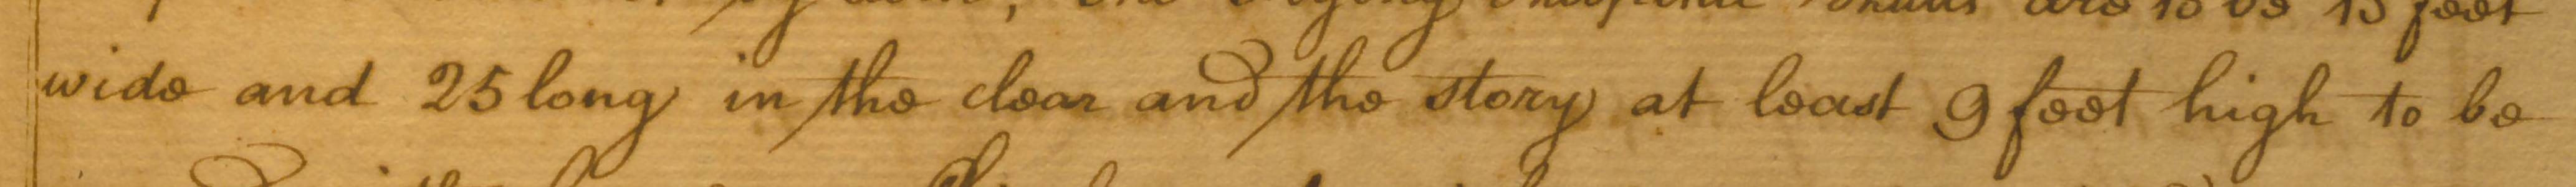wide and 25 long in the clear and the story at least 9 feet high to be
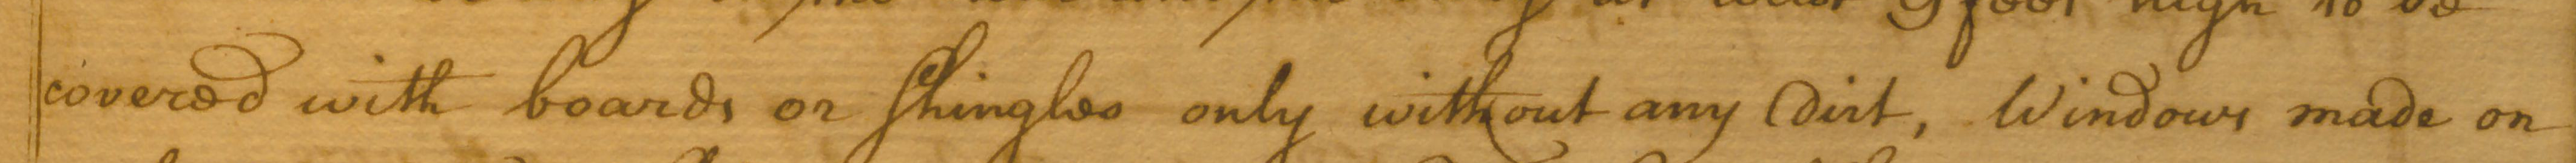covered with boards or shingles only without any dirt. Windows made on
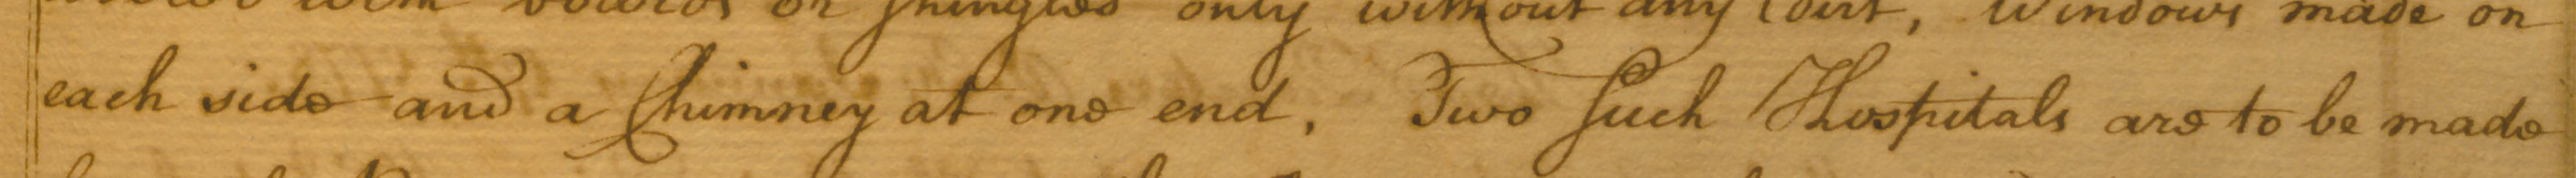each side and a Chimney at one end. Two such Hospitals are to be made
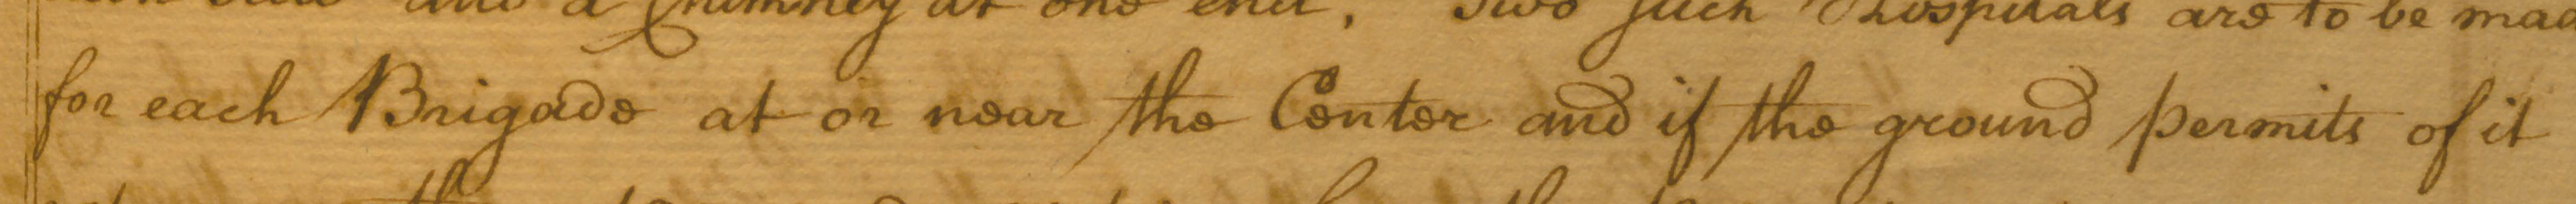for each Brigade at or near the Center and if the ground permits of it
